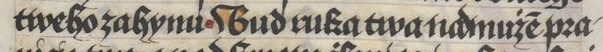tweho zahynu.Bud ruka twa nadmużē pra¬
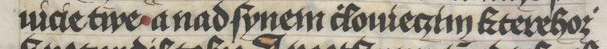uicie twe.a nad ſynem ċlouieczim kterehoż
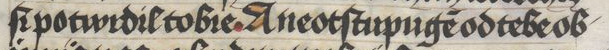ſi potwrdil tobie.A neotſtupugē odtebe ob¬
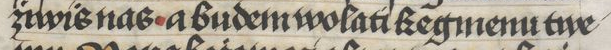żiwiṡ nas.a budem wolati kegmenu twe¬
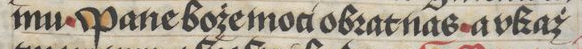mu.Pane boże moci obrat nas.a vkaż
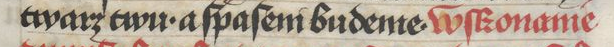twarz twu.a ſpaſeni budeme.Wſkonanie
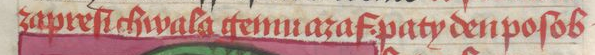zapreſi chwala gemu azaf.paty den poſob
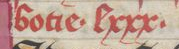botie.lxxx.
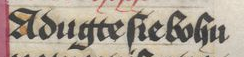Adugte ſie bohu
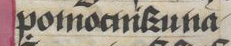pomocniku na¬
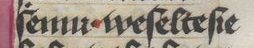ſemu.weſelteſie
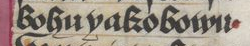bohu yakobowu.
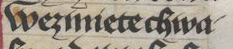Wezmiete chwa
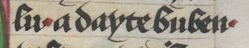lu.a dayte buben.
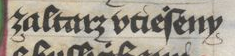zaltarz vtieẛeny
